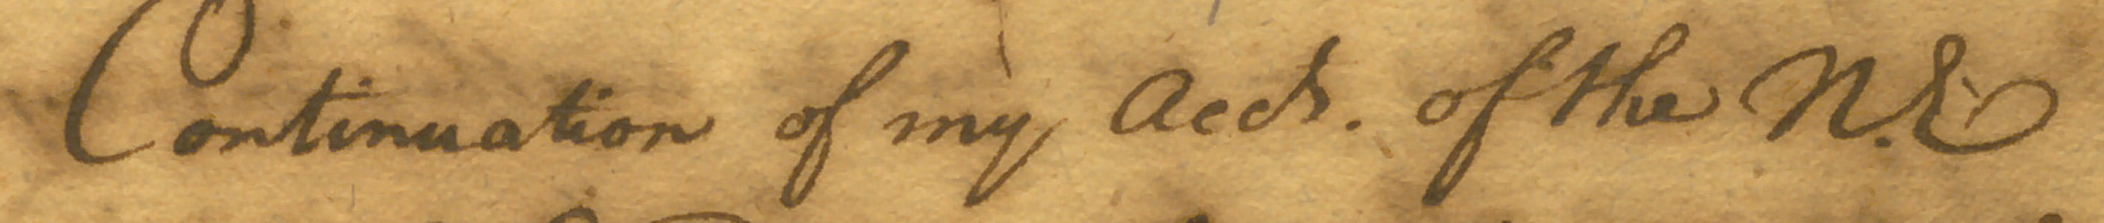Continuation of my Acc^t. of the N.E
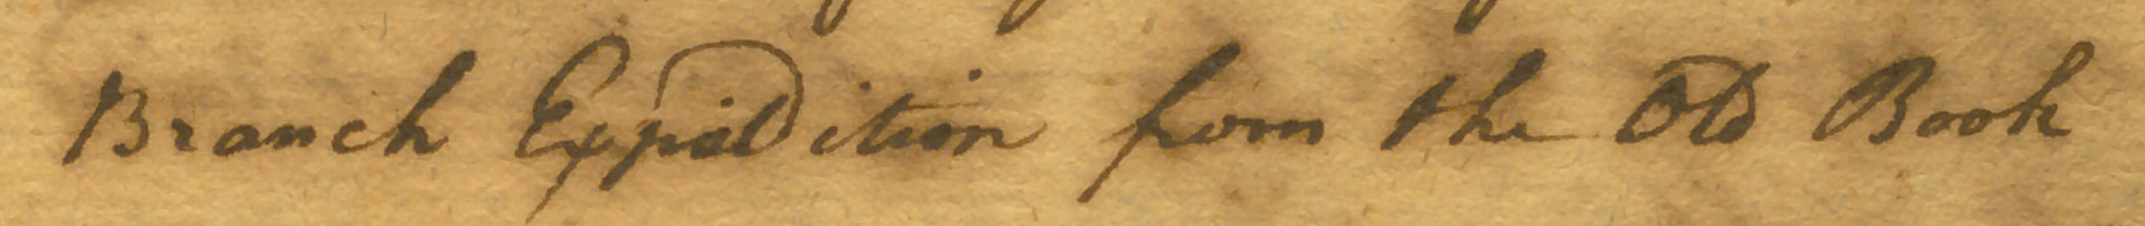Branch Expedition from the Old Book
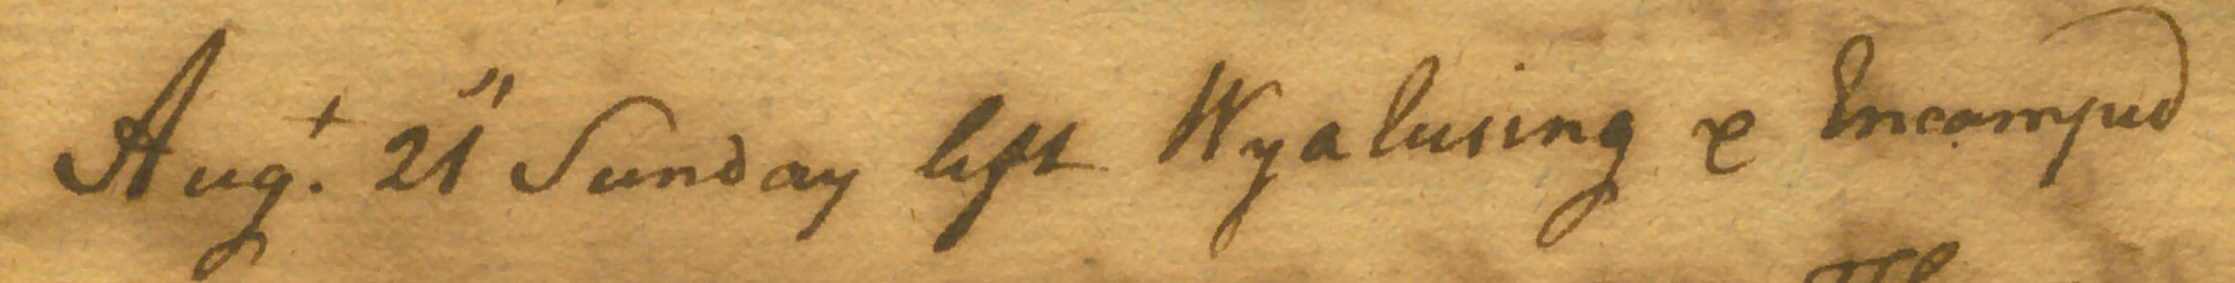Aug^t. 21^st Sunday left Wyalusing & Encamped
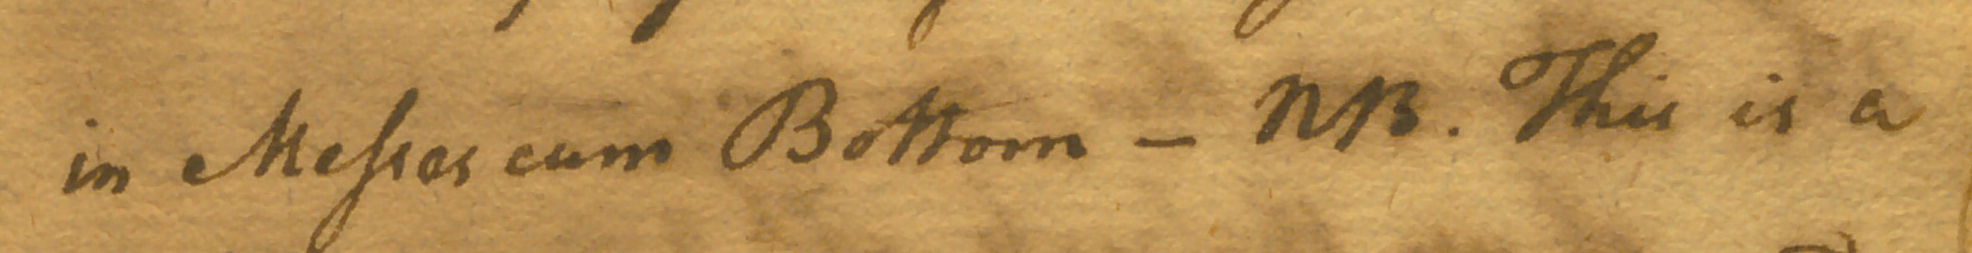in Messescum Bottom - NB. This is a
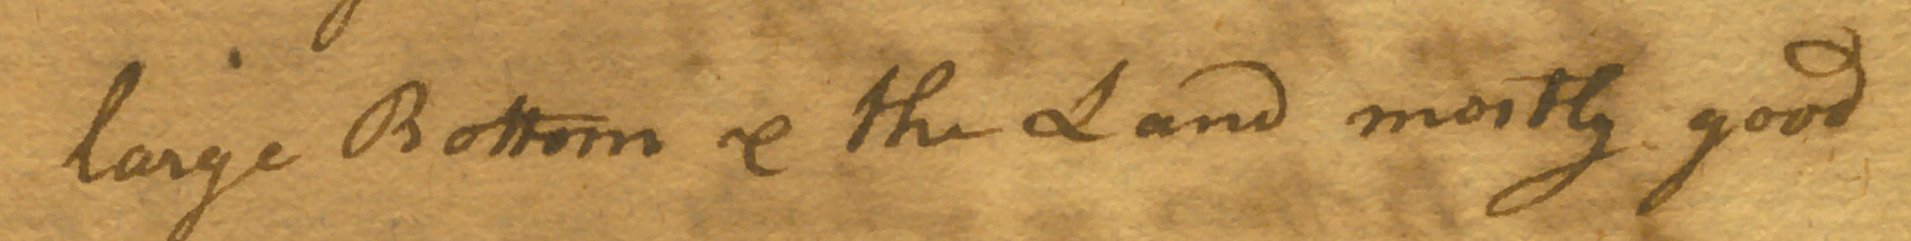large Bottom & the Land mostly good
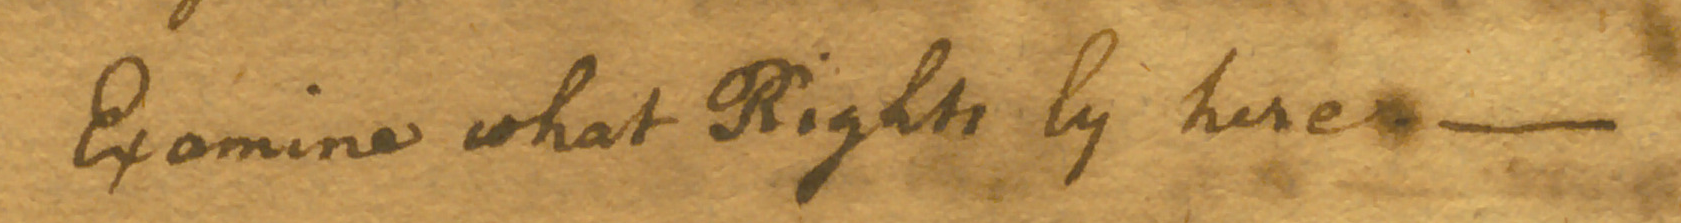Examine what Rights ly here.-
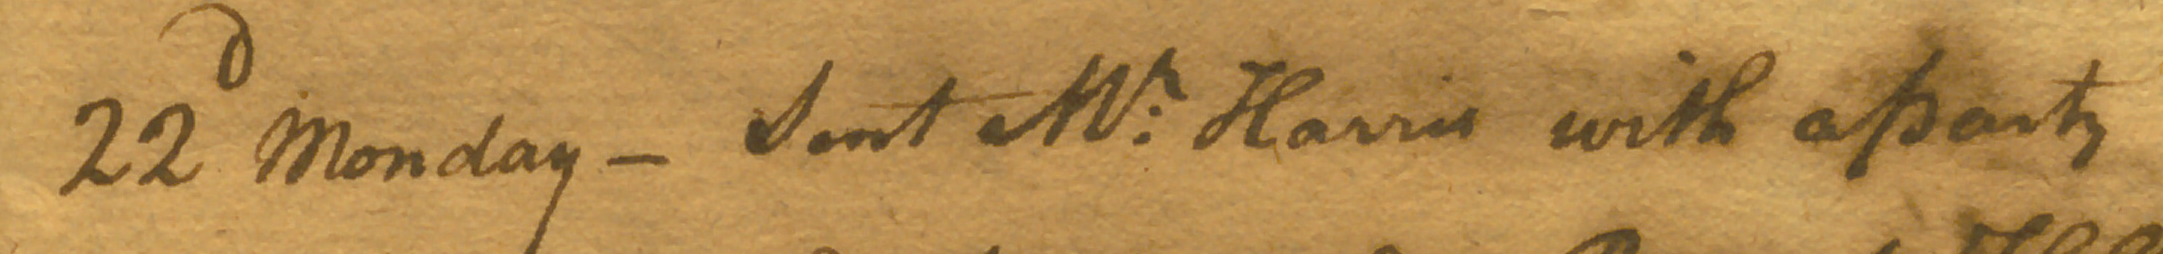22^d Monday- Sent M^r: Harris with a party
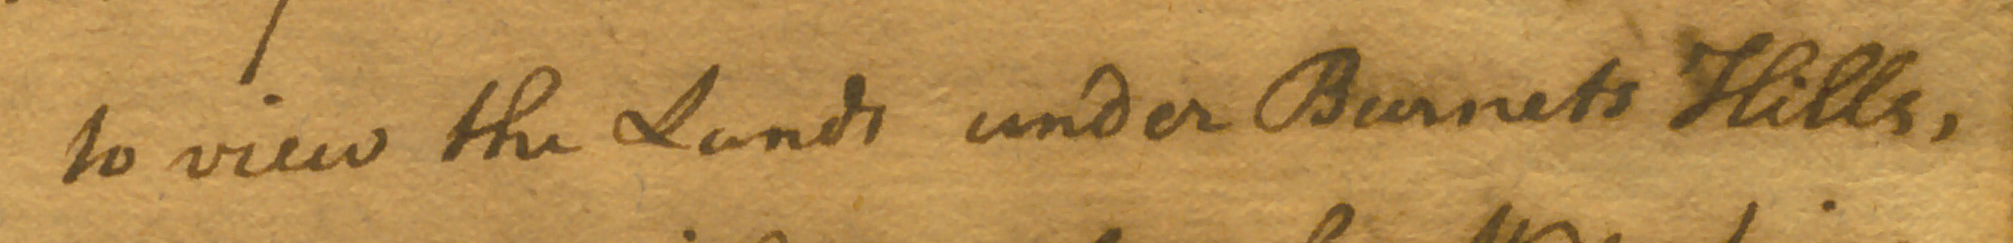to view the Lands under Burnets Hills,
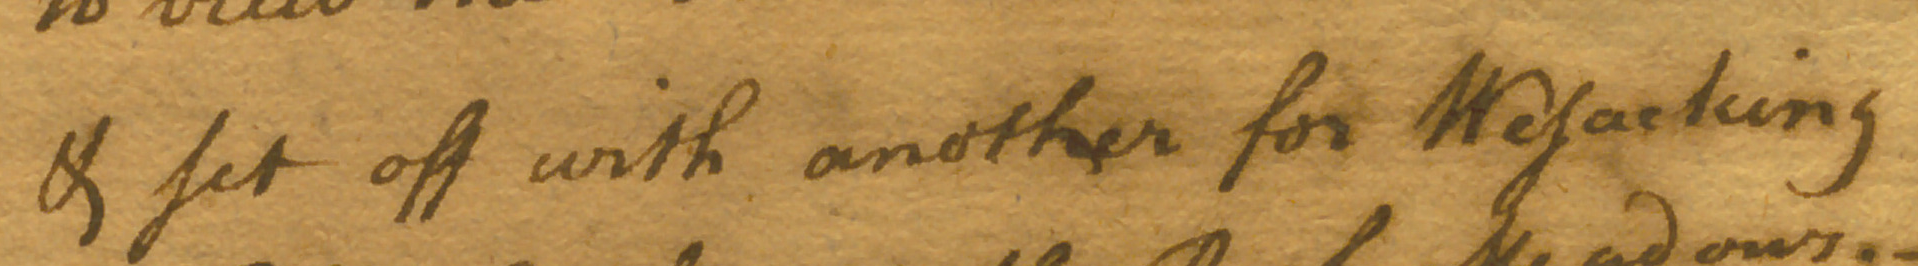& set off with another for Wesacking
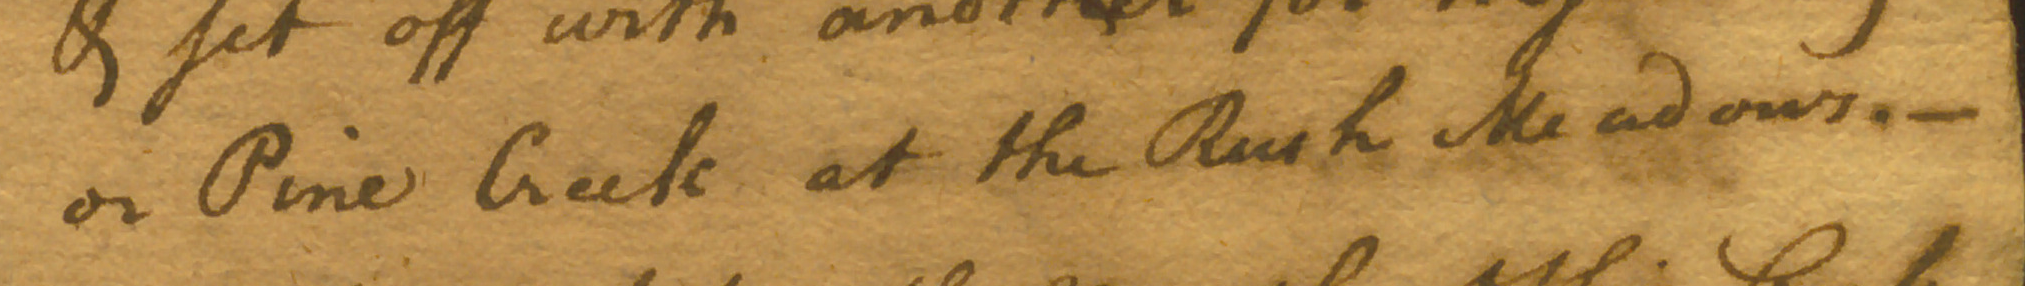or Pine Creek at the Rush Meadows.-
